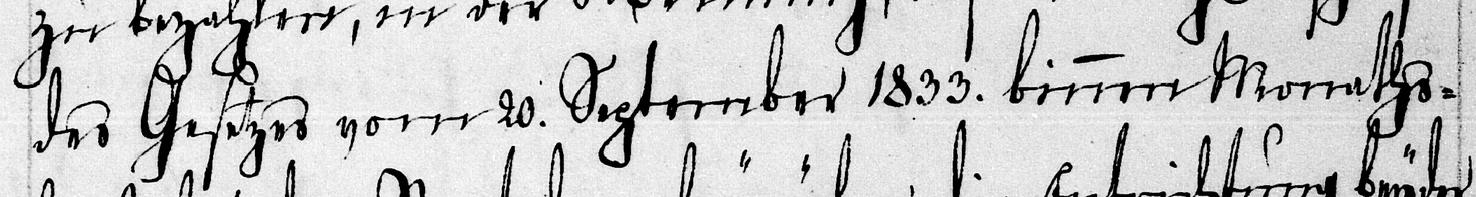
des Gesetzes vom 20. September 1833. binnen Monaths¬
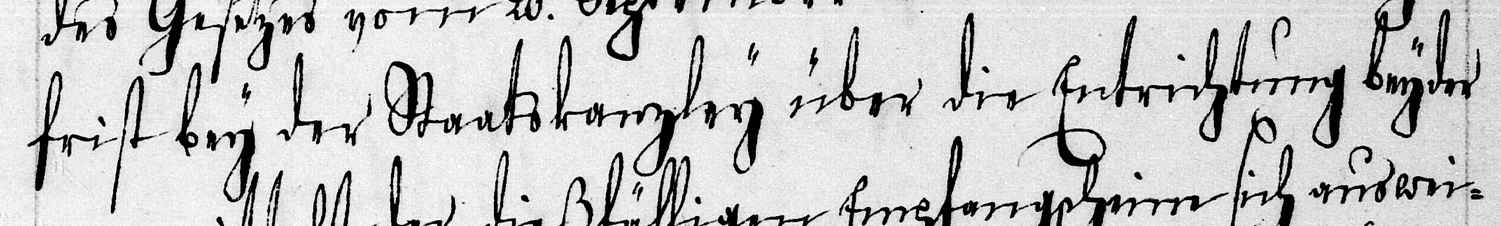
frist bey der Staatskanzley über die Entrichtung beyder
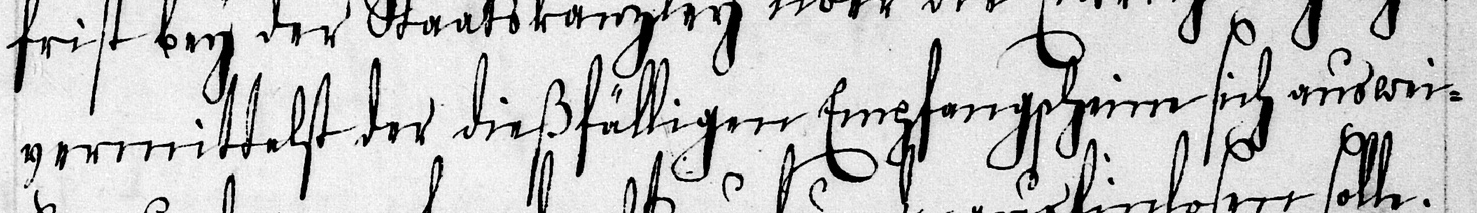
vermittelst der dießfälligen Empfangscheine sich auswei¬
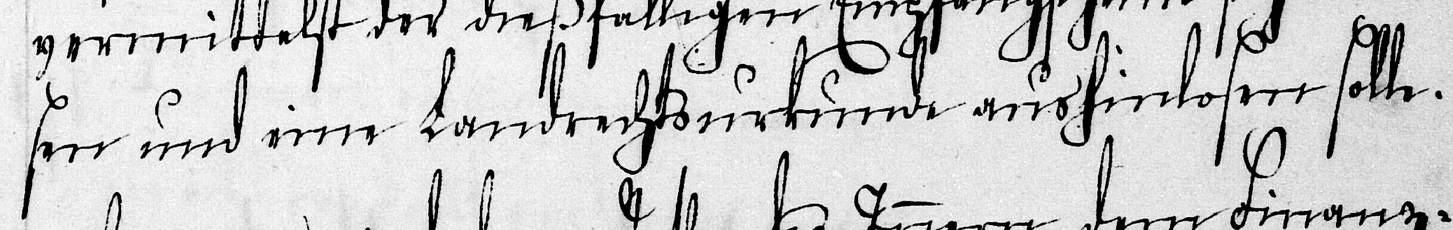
sen und eine Landrechtsurkunde aushinlösen solle.
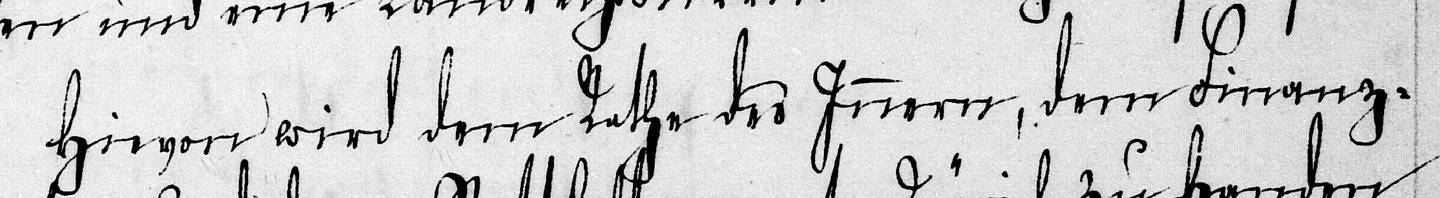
Hievon wird dem Rathe des Innern, dem Finanz¬
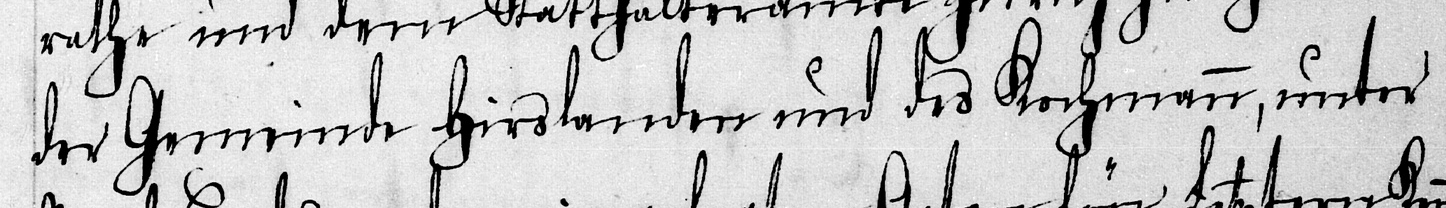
der Gemeinde Hirslanden und des Kochmann, unter
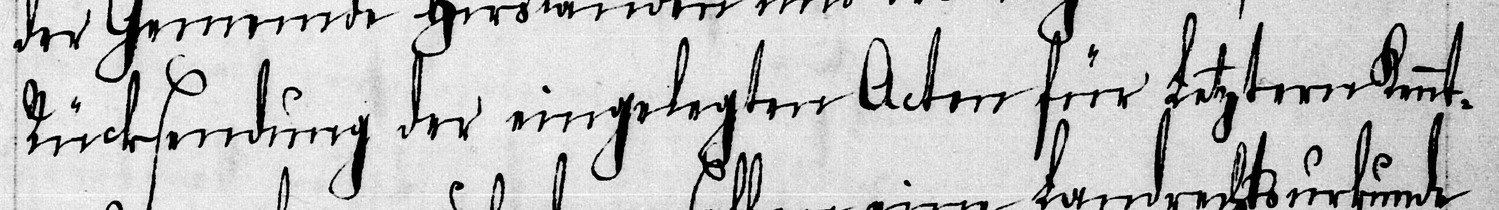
Rücksendung der eingelegten Acten für Letztern Kennt¬
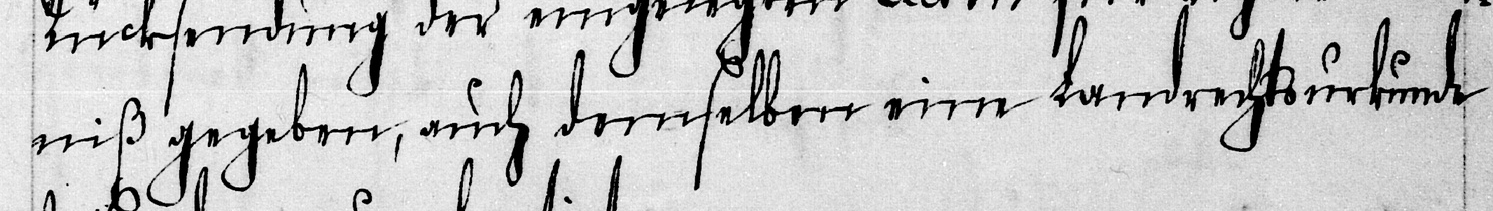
niß gegeben, auch demselben eine Landrechtsurkunde
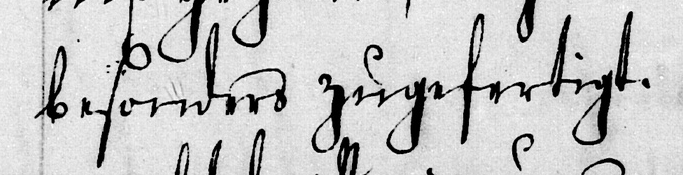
besonders zugefertigt.
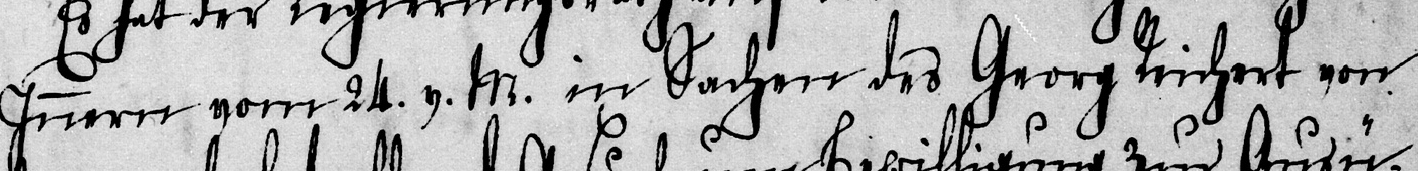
Innern vom 24. v. M. in Sachen des Georg Reichert von
